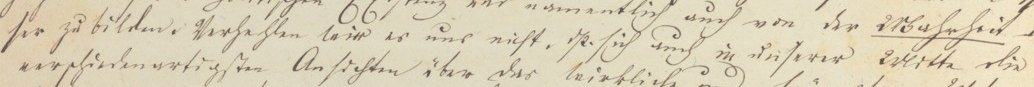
ser zu bilden. Verhehlen wir es uns nicht, dß. sich auch in unserer Mitte die
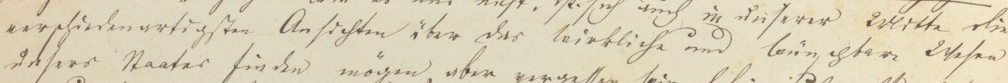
verschiedenartigsten Ansichten über das wirkliche und wünschbare Wesen
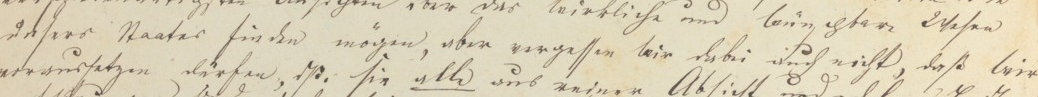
unsers Staates finden mögen, aber vergessen wir dabei auch nicht, daß wir
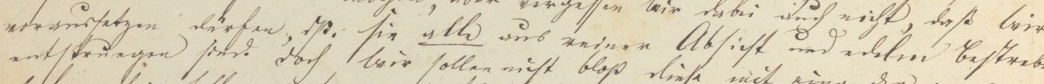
voraussetzen dürfen, dß. sie alle aus reiner Absicht und edelm Bestreben
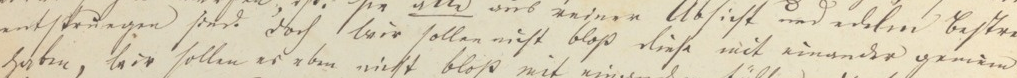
entsprungen sind. Doch wir sollen nicht bloß diese mit einander gemein
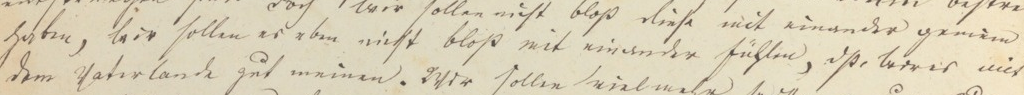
haben, wir sollen es eben nicht bloß mit einander fühlen, dß. wir es mit
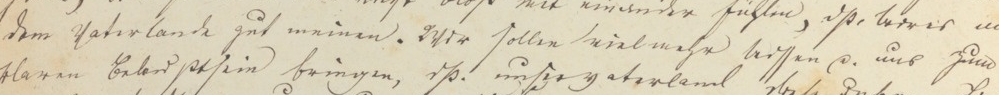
dem Vaterlande gut meinen. Wir sollen vielmehr wissen &. uns zum
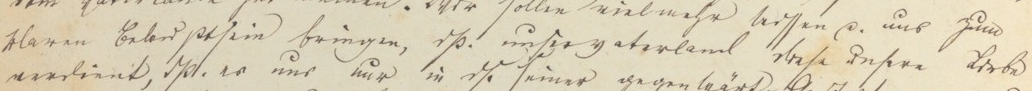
klaren Bewußtsein bringen, dß. unser Vaterland diese unsere Liebe
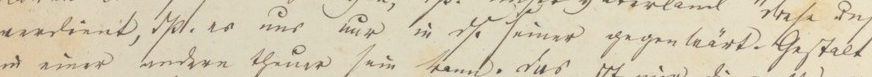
verdient, dß. es uns nur in ds. seiner gegenwärt. Gestalt
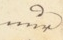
nur
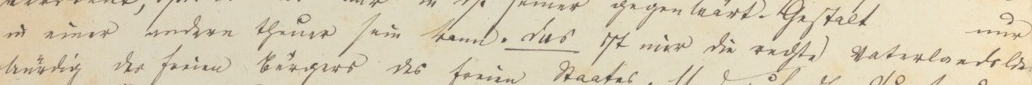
in einer andern theuer sein kann. Das ist mir die rechte Vaterlandsliebe
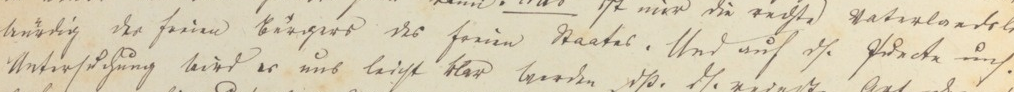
würdig des freien Bürgers des freien Staates. Und auf ds. Puncte uns.
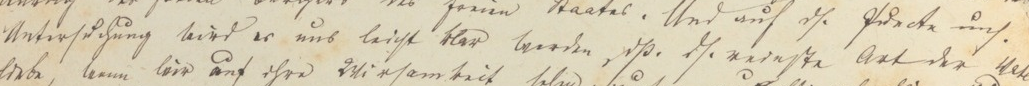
Untersuchung wird es uns leicht klar werden, dß. ds. reinste Art der Vld -
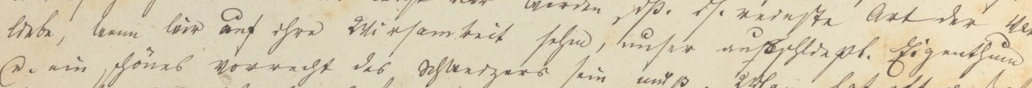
liebe, wenn wir auf ihre Wirsamkeit sehen, unser ausschließl. Eigenthum
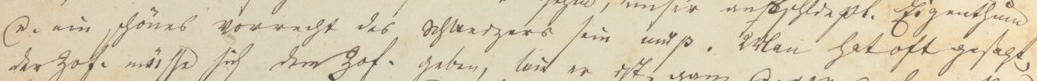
&. ein schönes Vorrecht des Schweizers sein muß. Man hat oft gesagt,
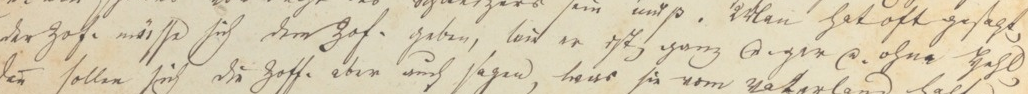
der Zof. müsse sich dem Zof. geben, wie er ist, ganz & gar &. ohne Hehl,
